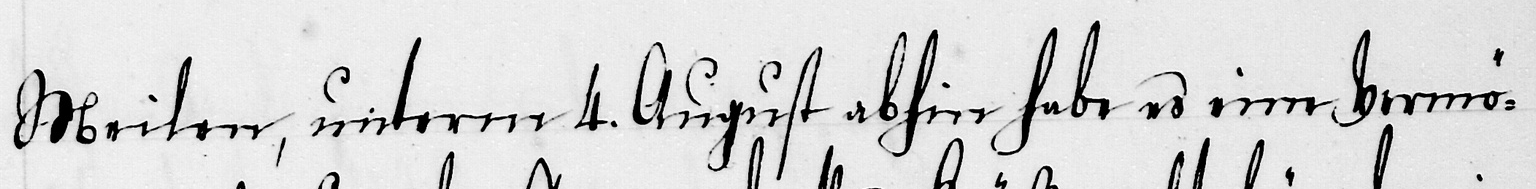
Meilen, unterm 4. August abhin habe es eine Vermö¬
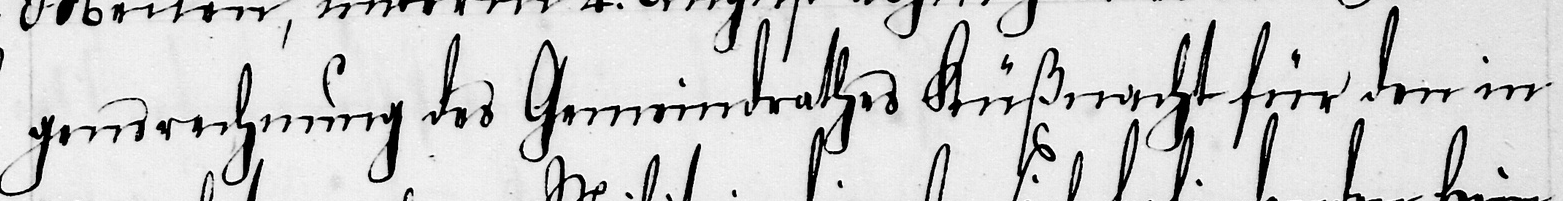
gensrechnung des Gemeindrathes Küßnacht für den in
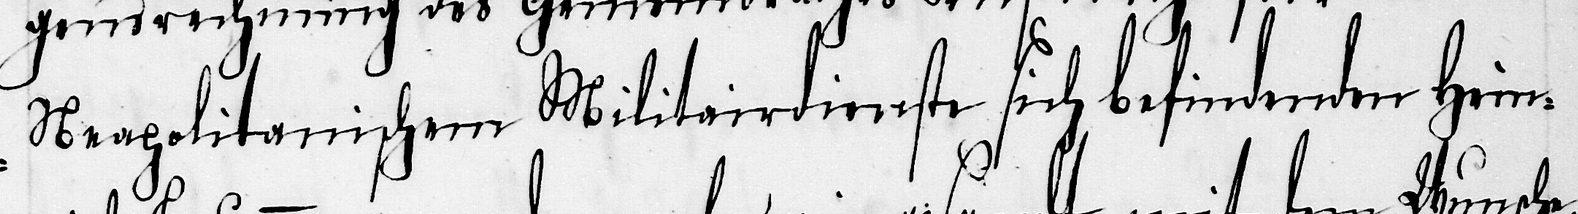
Neapolitanischem Militairdienste sich befindenden Hein¬
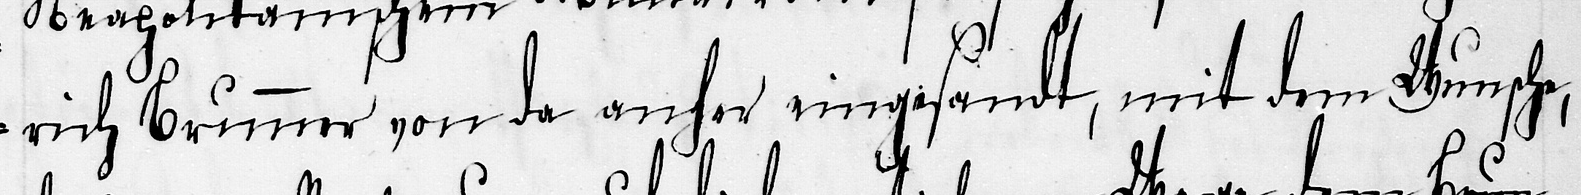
rich Brunner von da anher eingesandt, mit dem Wunsche,
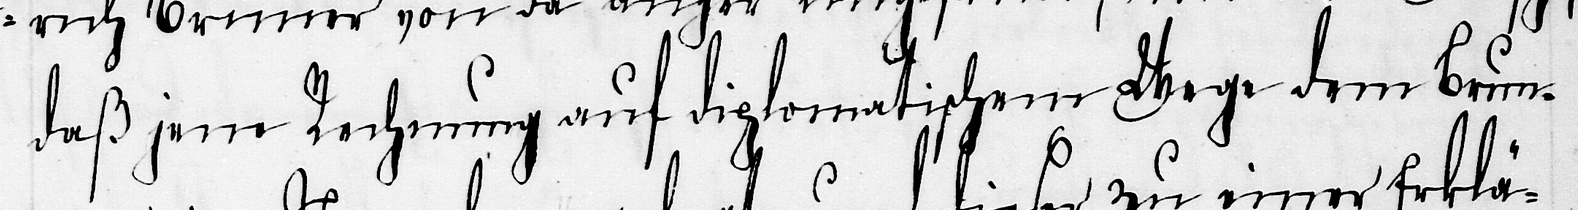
daß jene Rechnung auf diplomatischem Wege dem Brun¬
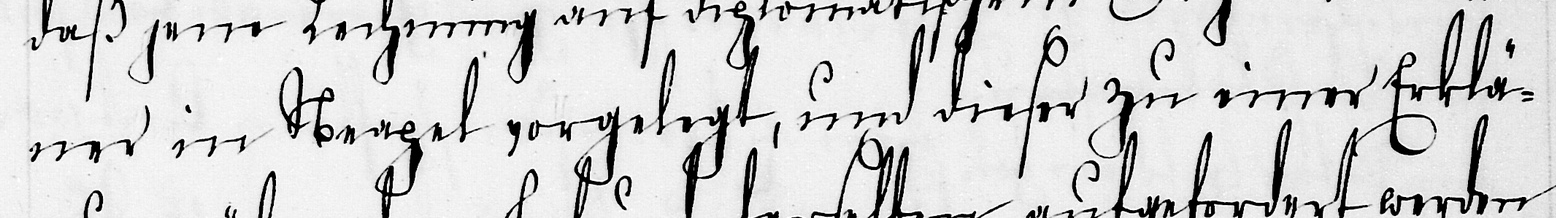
ner in Neapel vorgelegt, und dieser zu einer Erklä¬
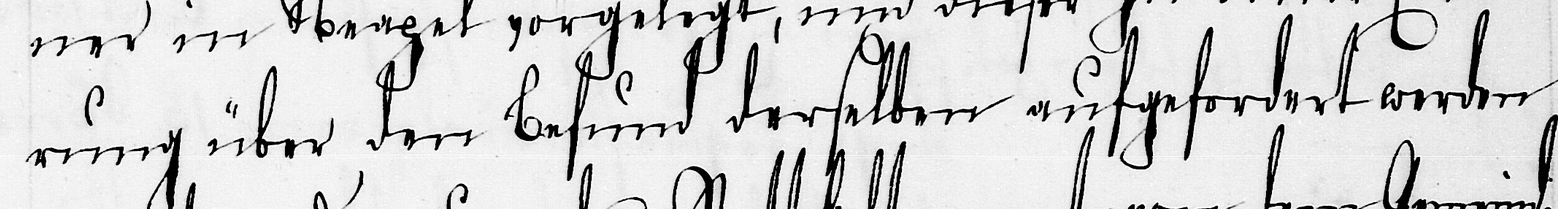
rung über den Befund derselben aufgefordert werden
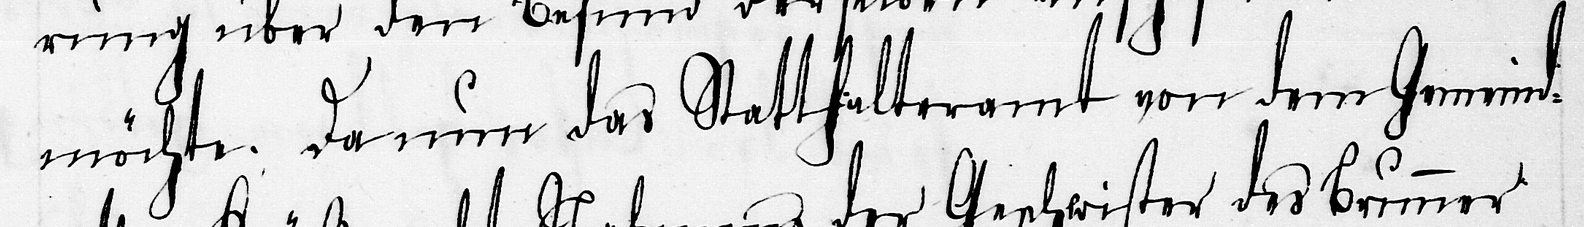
möchte. Da nun das Statthalteramt von dem Gemein¬
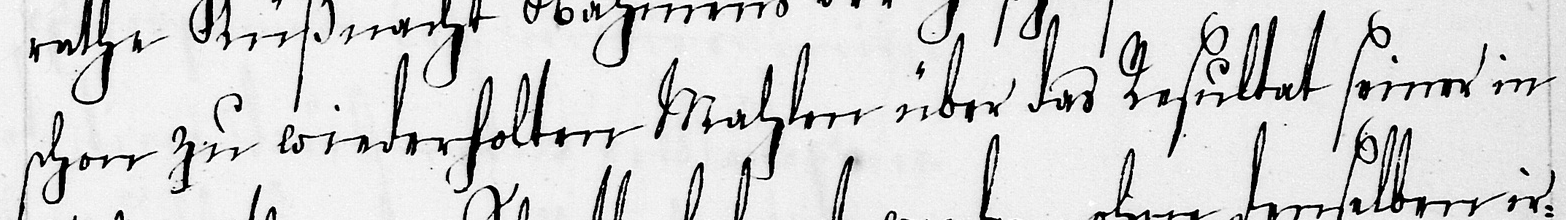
schon zu wiederholten Mahlen über das Resultat seiner in
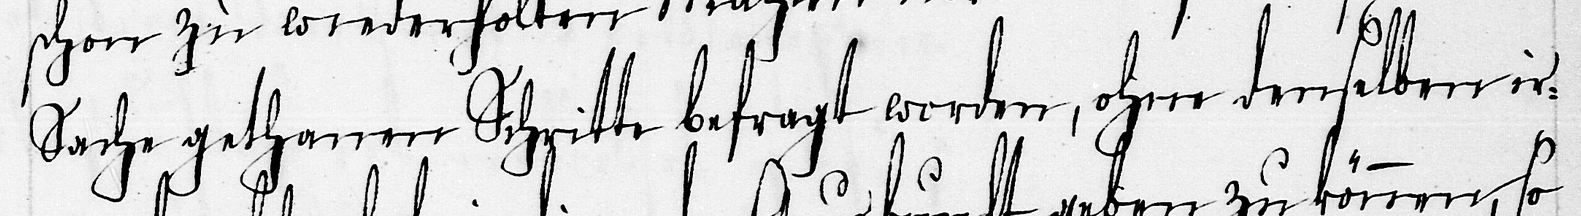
Sache gethanen Schritte befragt worden, ohne denselben ir¬
